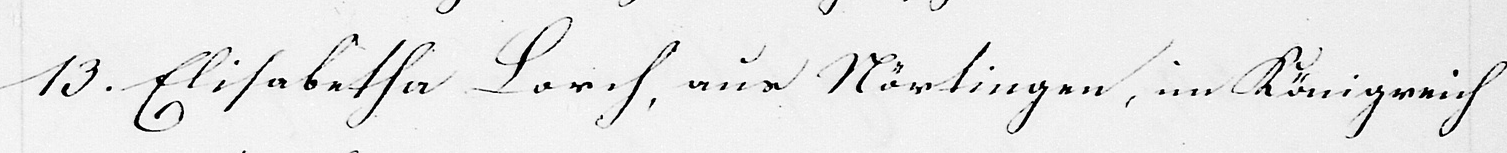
13. Elisabetha Lorch, aus Nörtingen, im Königreich
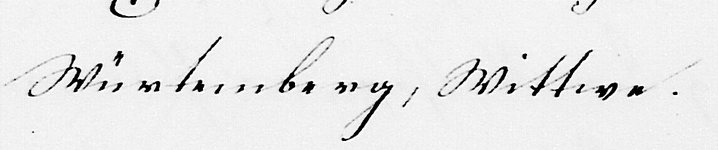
Würtemberg, Wittwe.
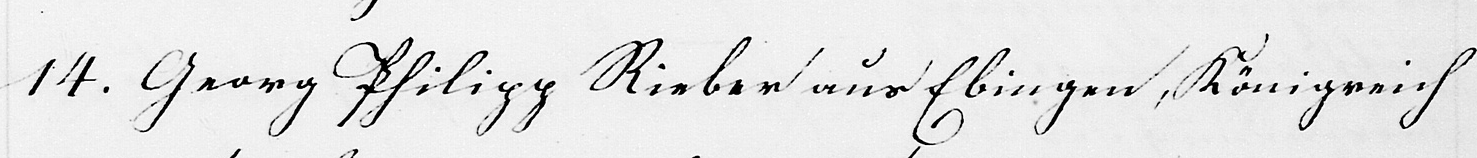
14. Georg Philipp Rieber aus Ebingen, Königreich
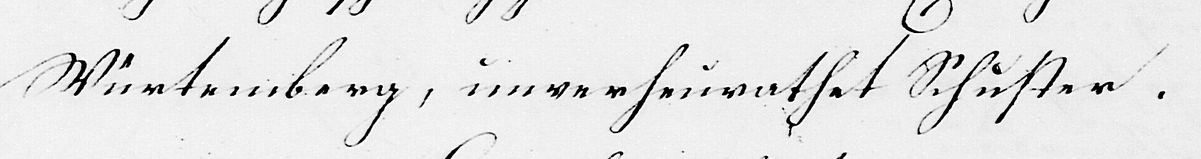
Würtemberg, unverheurathet Schuster.
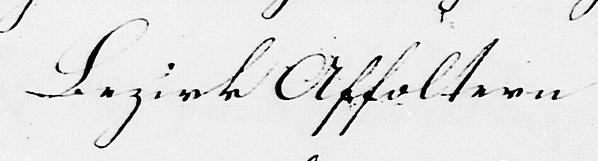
Bezirk Affoltern
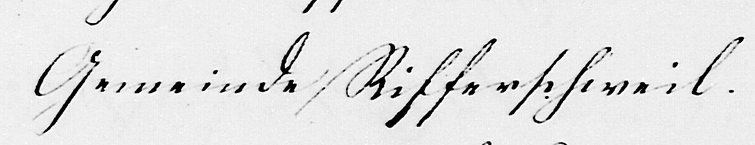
Gemeinde Rifferschweil.
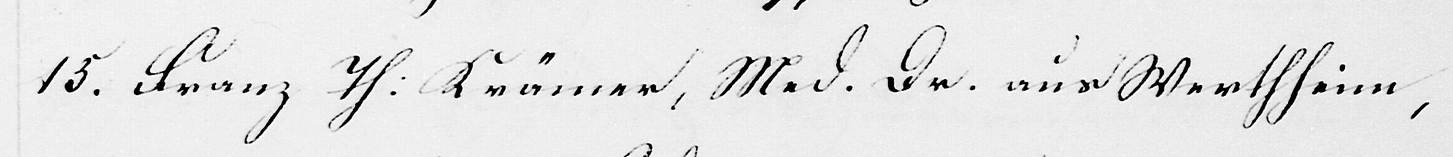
15. Franz Th: Krämer, Med. Dr. aus Werthheim,
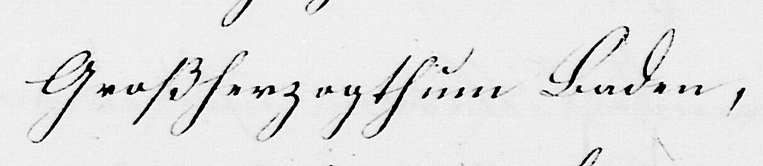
Großherzogthum Baden,
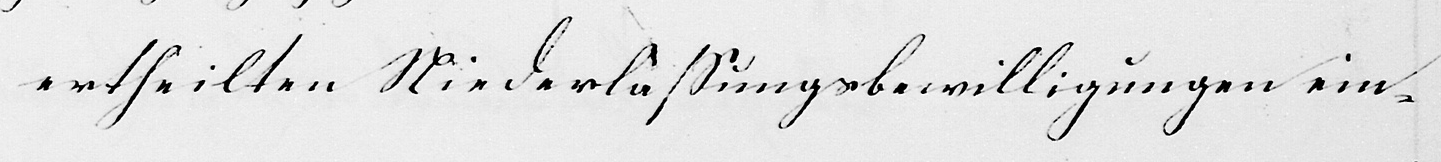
ertheilten Niederlaßungsbewilligungen ein-
